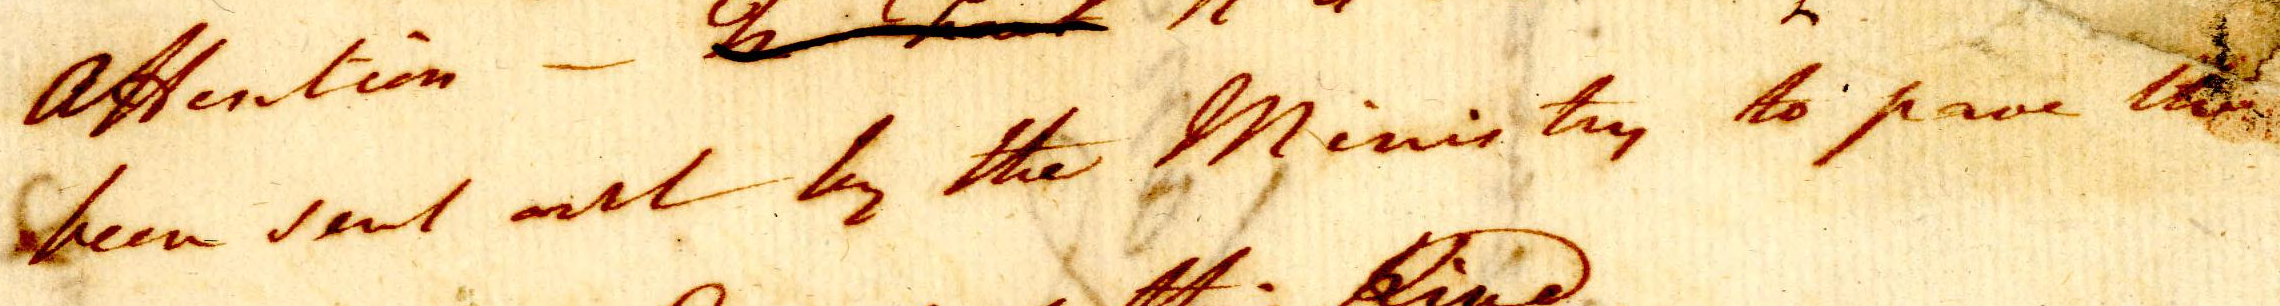been sent all by the Ministry to pave to
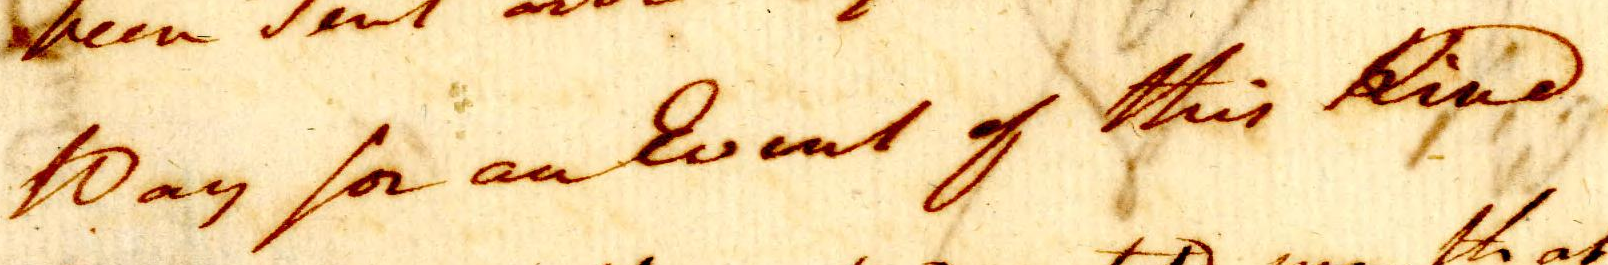Way for an Event of this Kind.
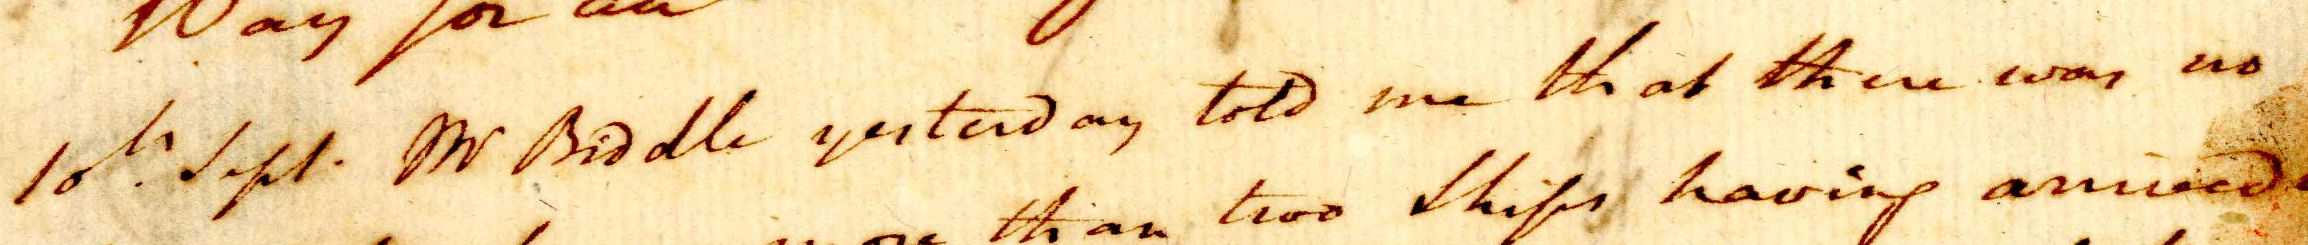10^th. Sept. M^r Biddle yesterday told me that there was no
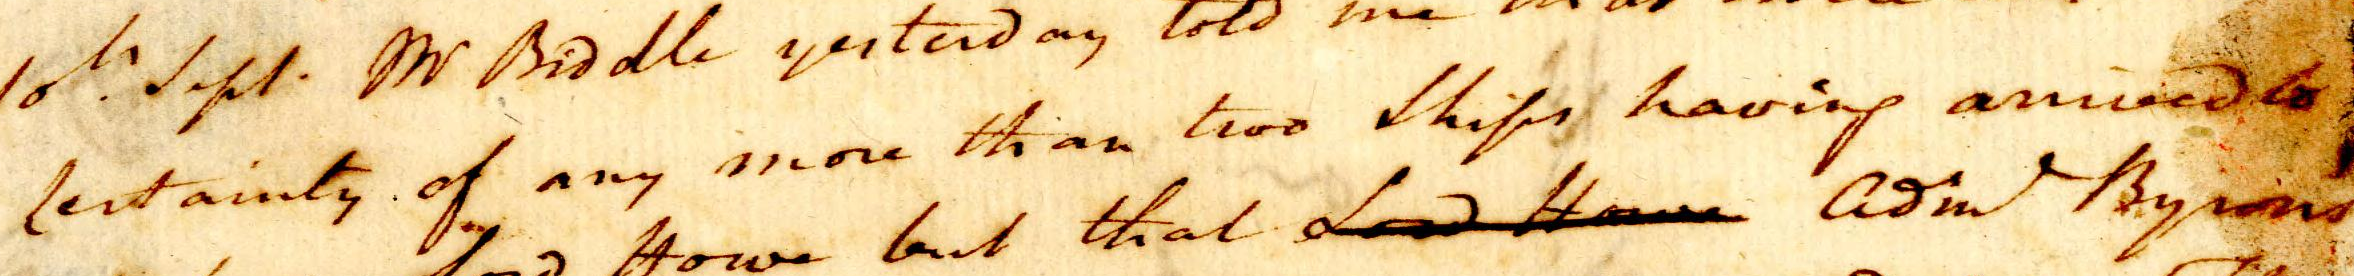Certainty of any more than two Ships having arrived to
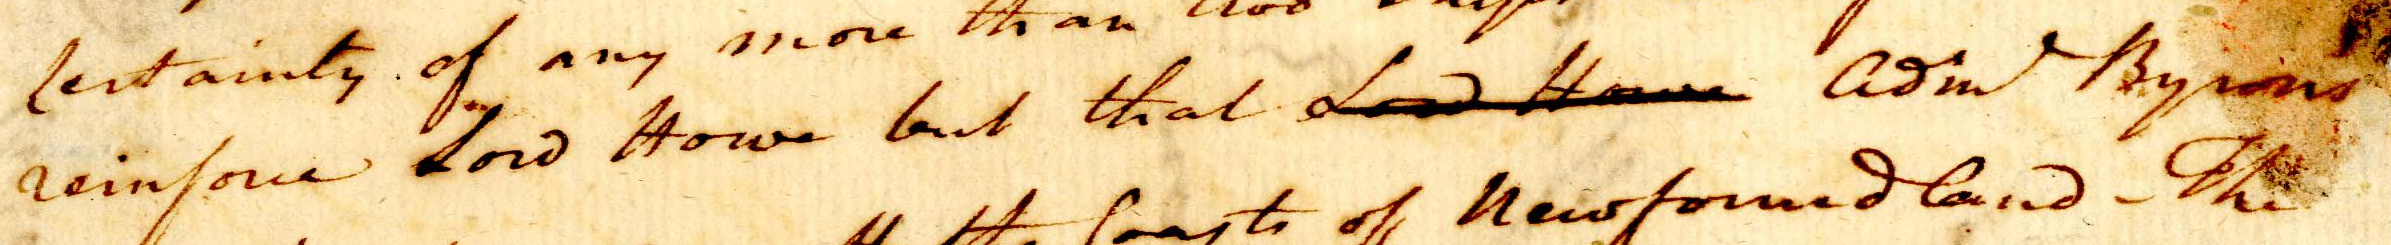reinforce Lord Howe but that Lord Howe Adm^l Byron's
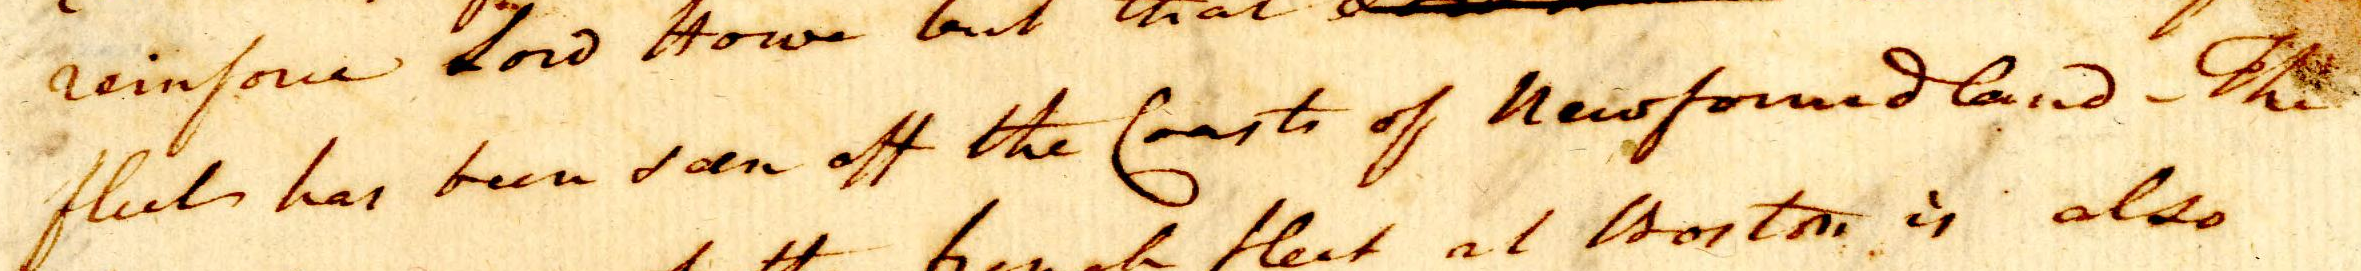fleets has been seen off the Coasts of Newfoundland.The
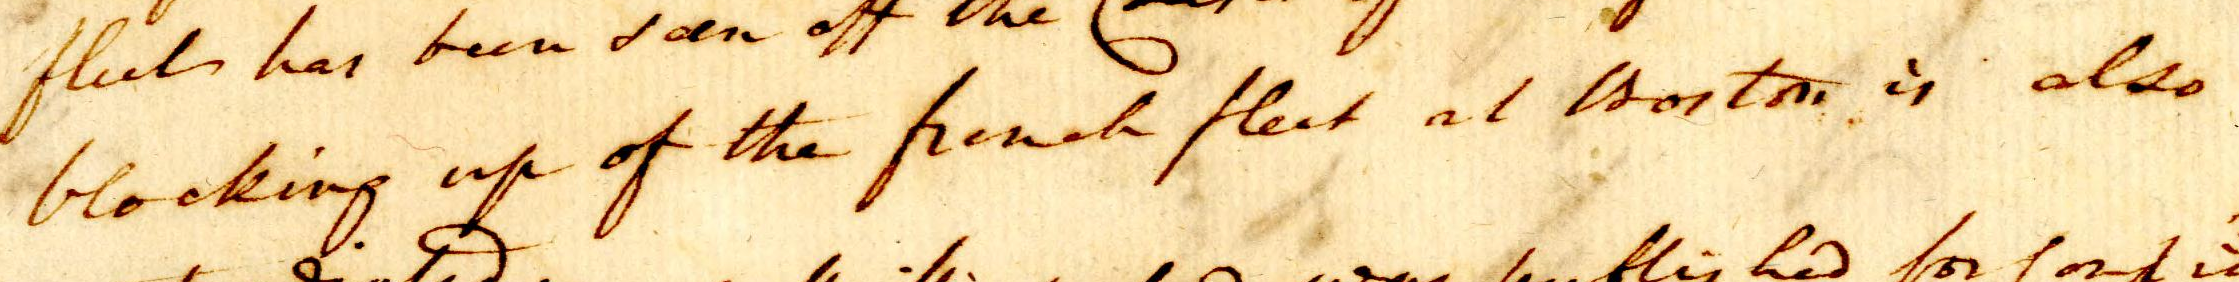blocking up of the French fleet at Boston is also
